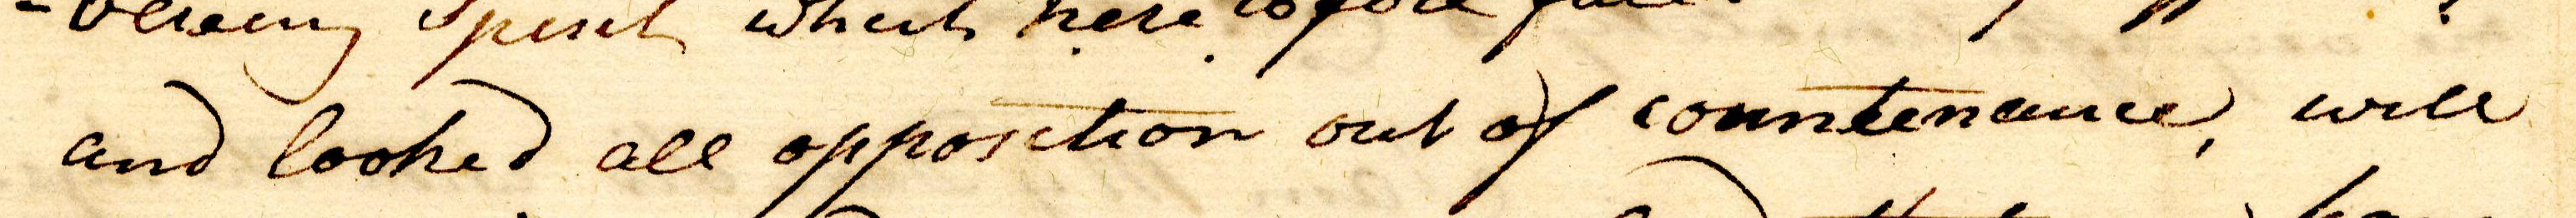and looked all opposition out of countenance will
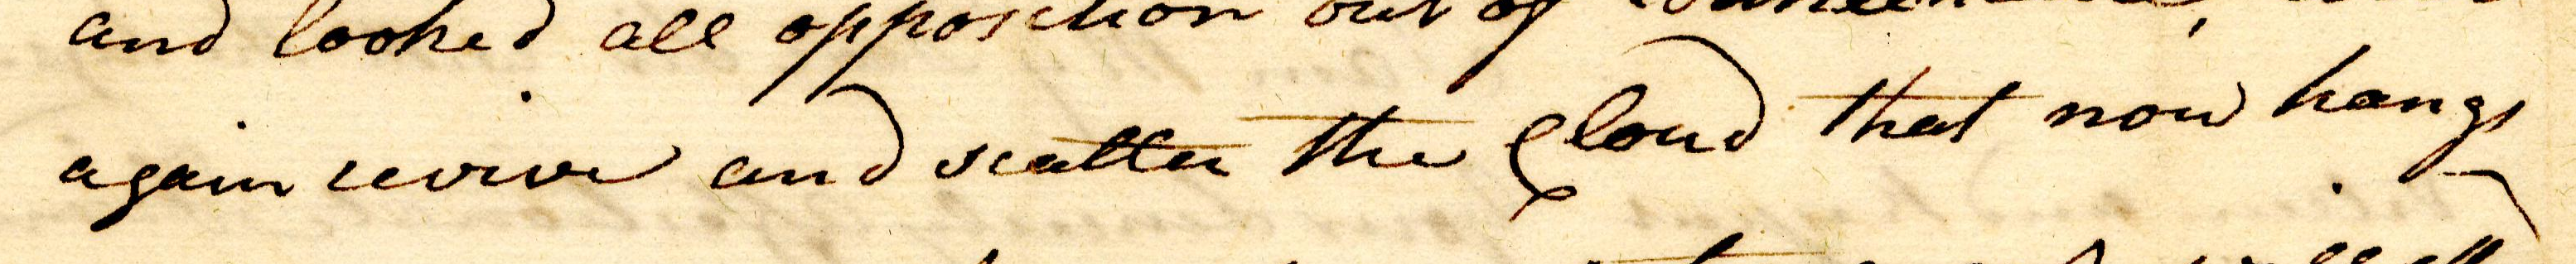again receive and scatter the Cloud that now hangs
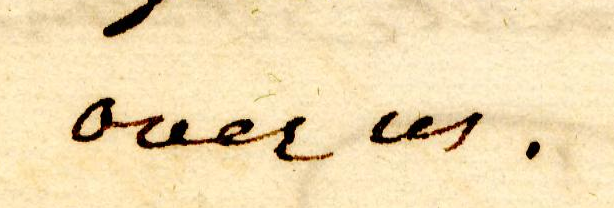over us.
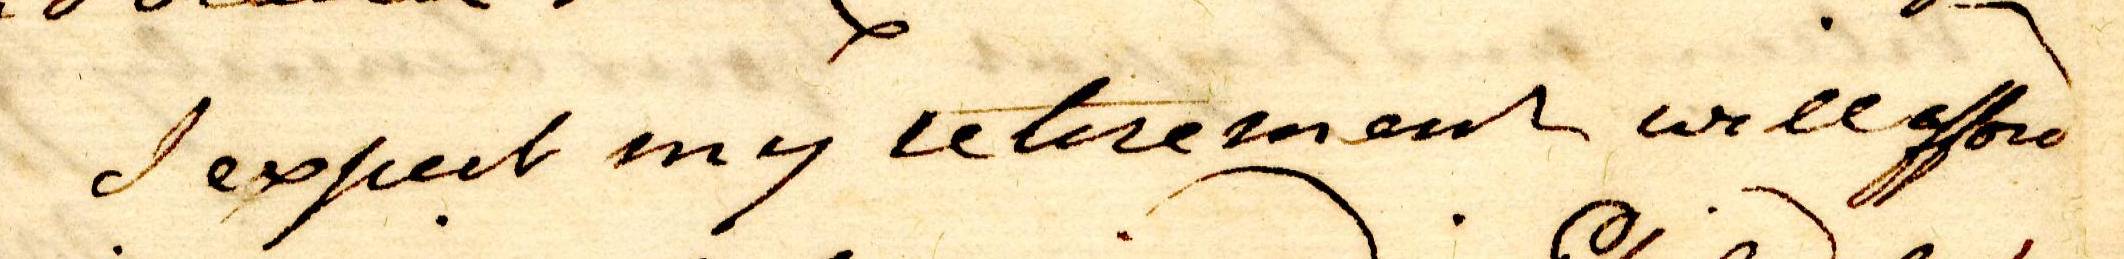I expect my retirement will offer
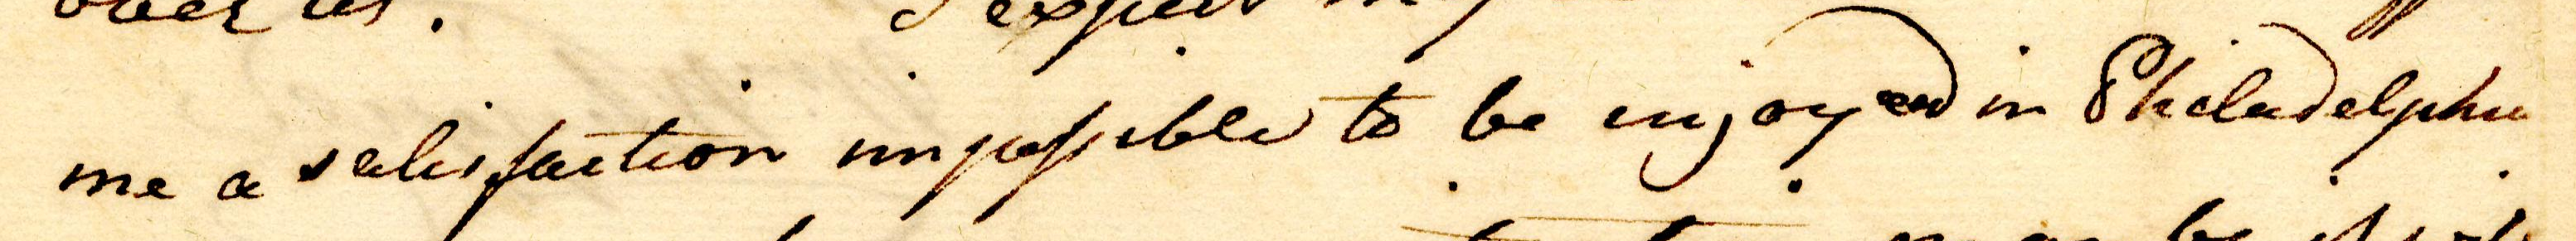me a satisfaction impossible to be enjoyed in Philadelphia
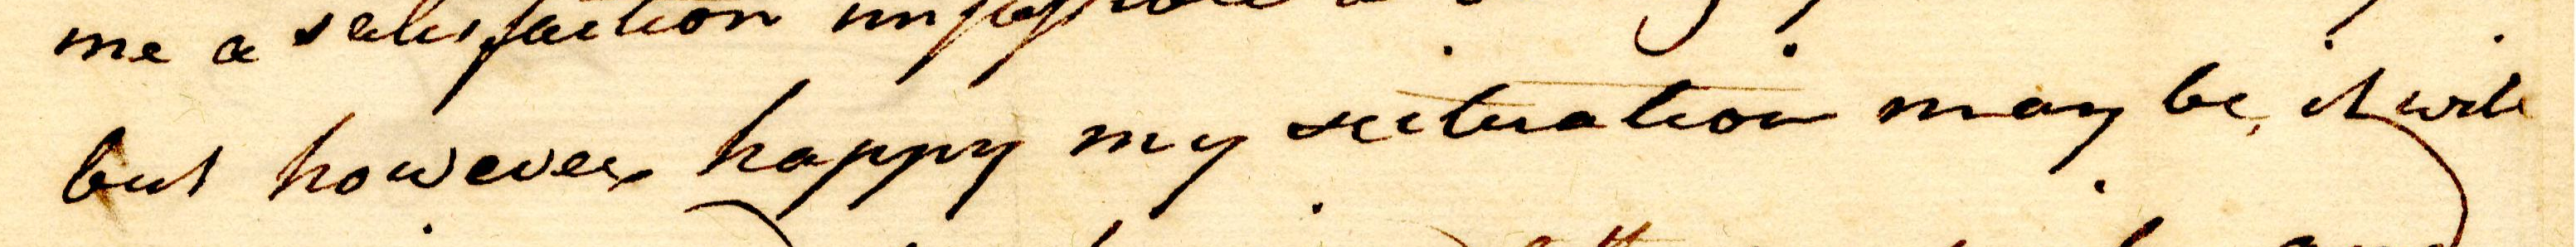but however happy my situation may be, it will
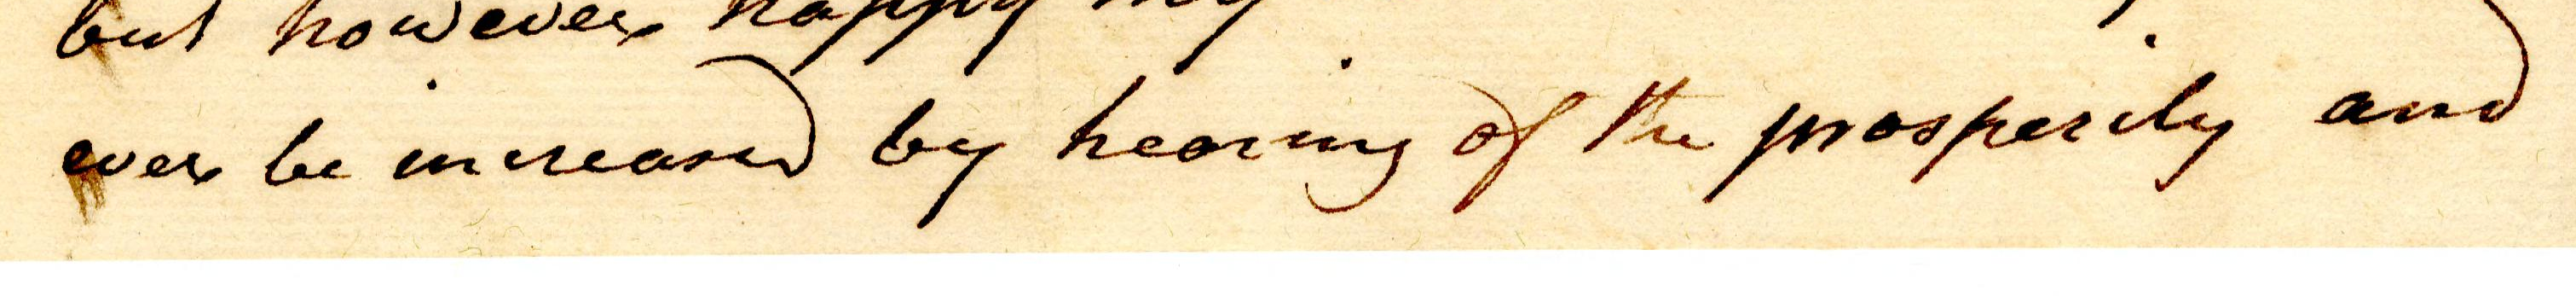ever be increased by hearing of the prosperity and
